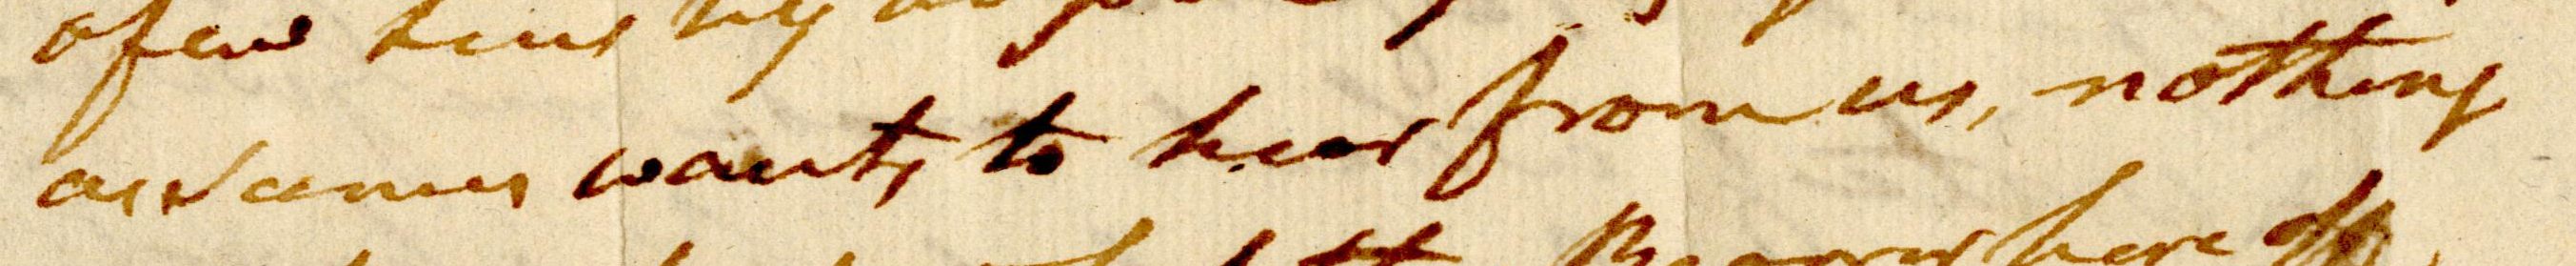as Some want to hear from us, nothing
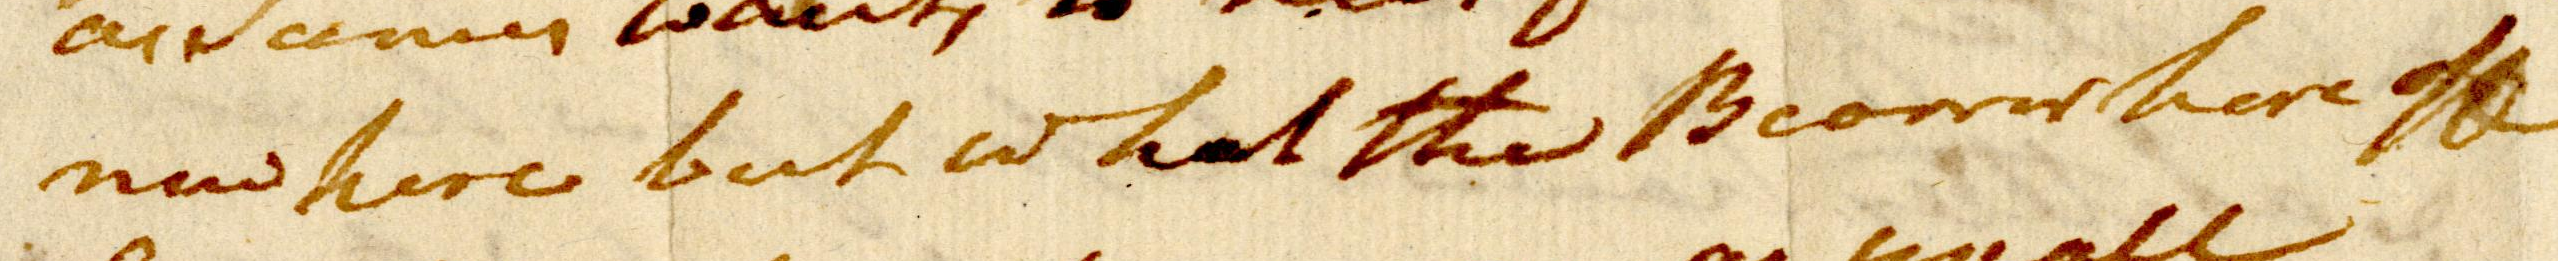new here but what the Bearer here off
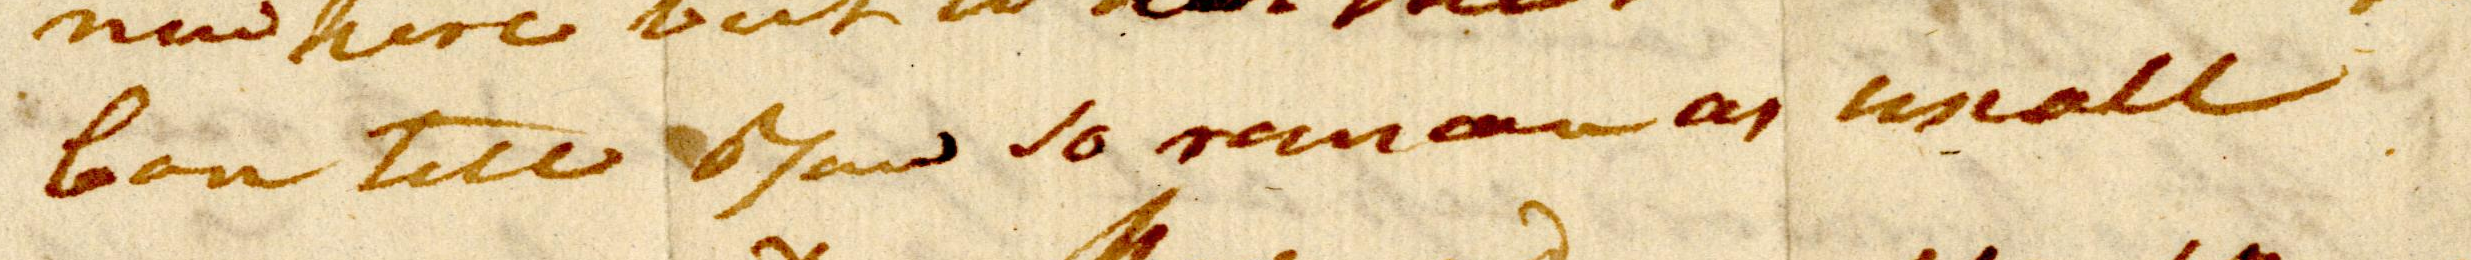Can tell you so remain as usuall
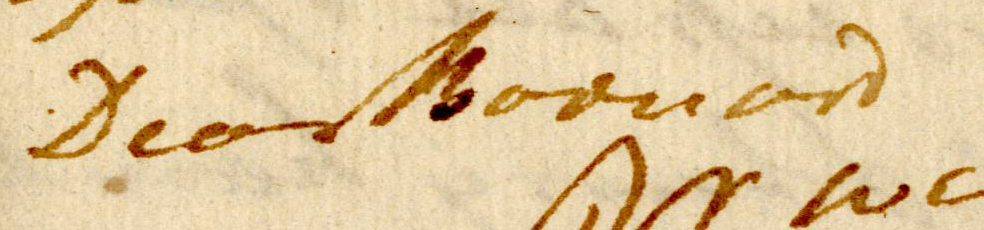Dear Barnard
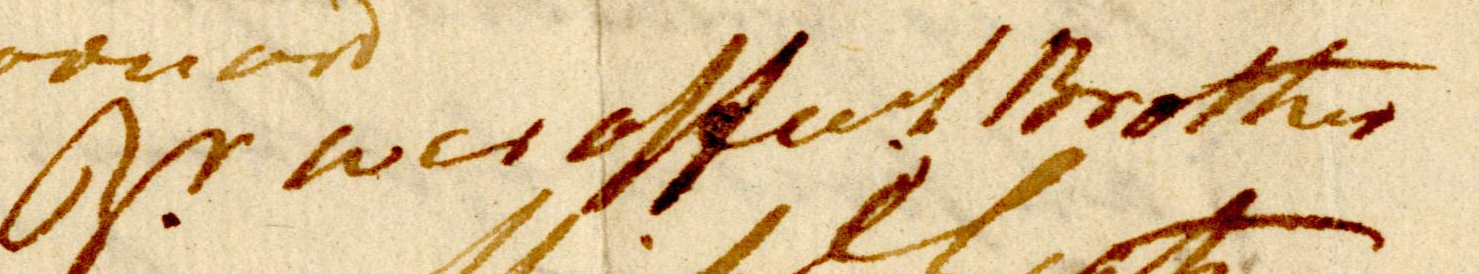Y^r very affect Brother
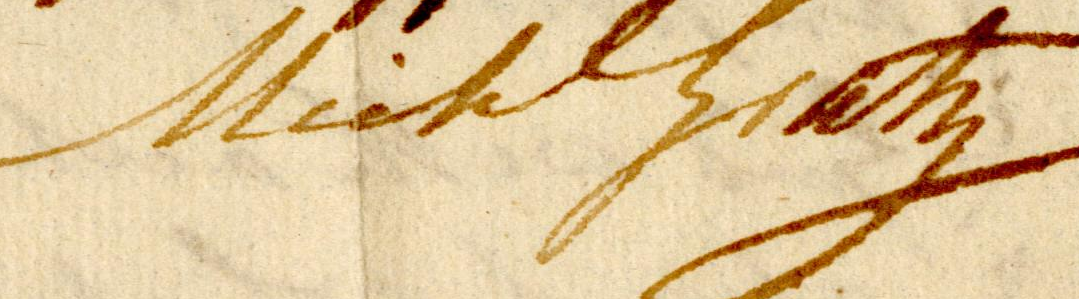Mich^l Gratz
